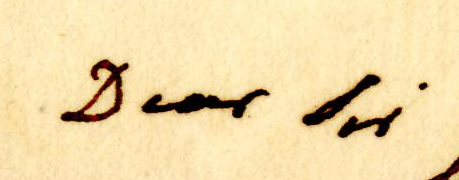Dear sir
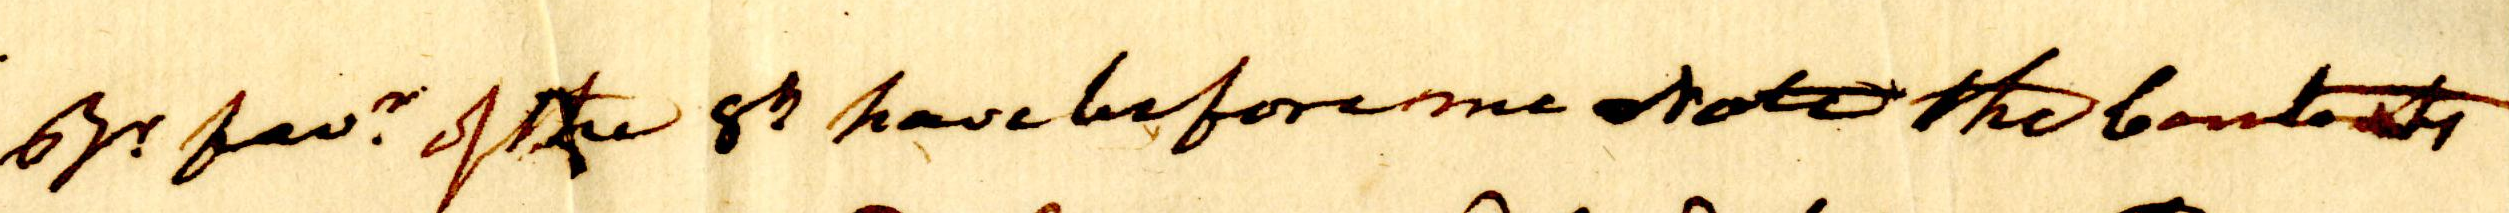Y^r. fav^r. of the 8^h have before me Note the Contents
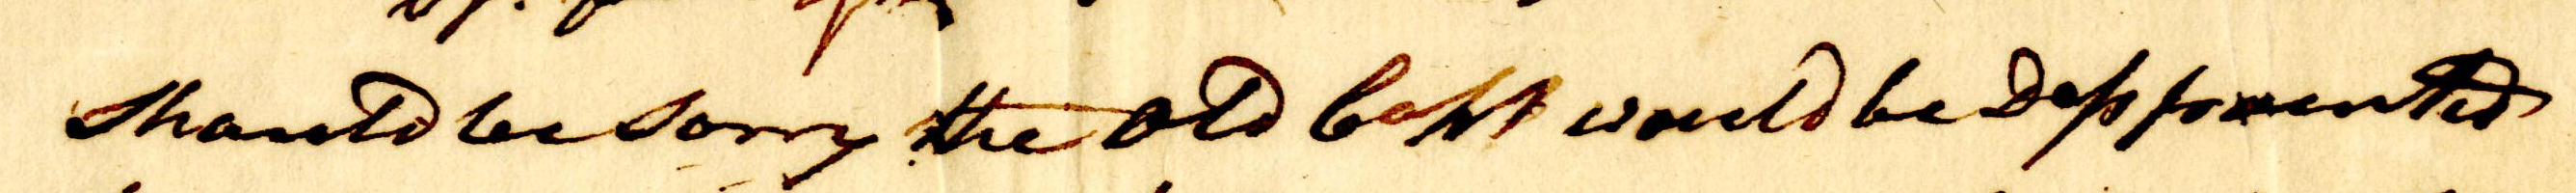should be sorry the old Capt would be desspointed
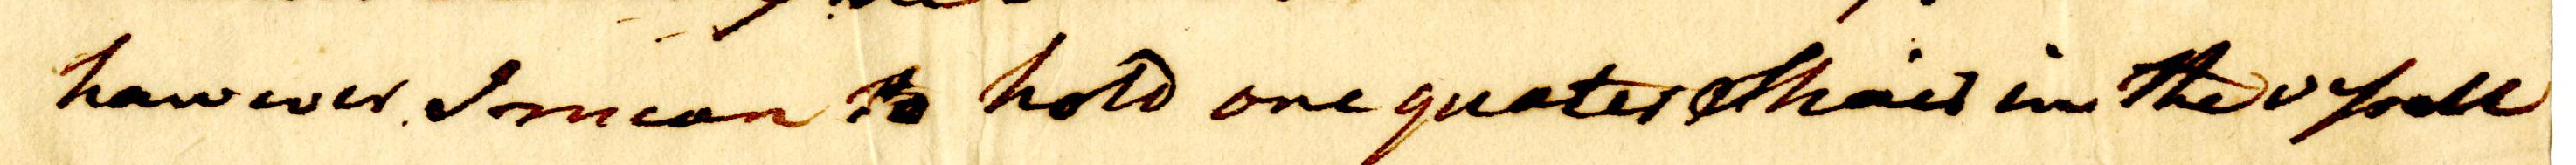however I mean to hold one quater shair in the vessell
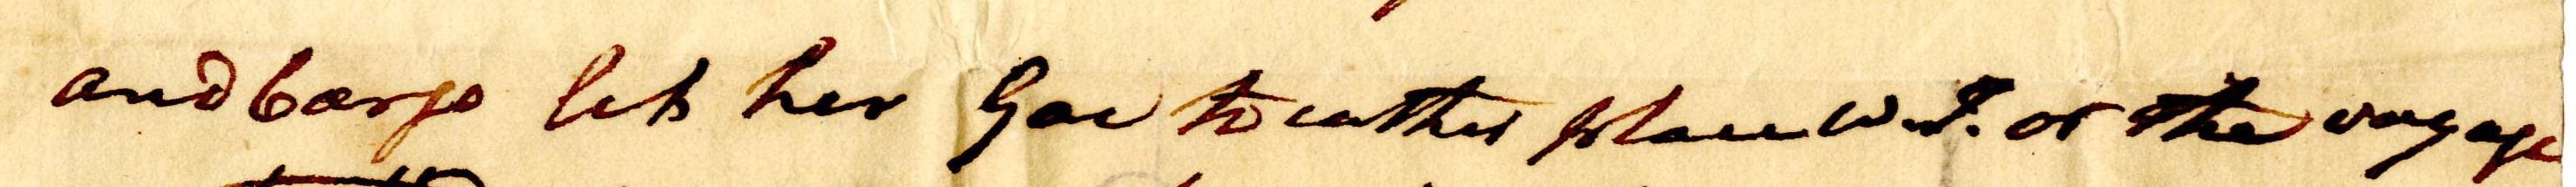and Cargo let her Goe to cather place W.I. or the voyage
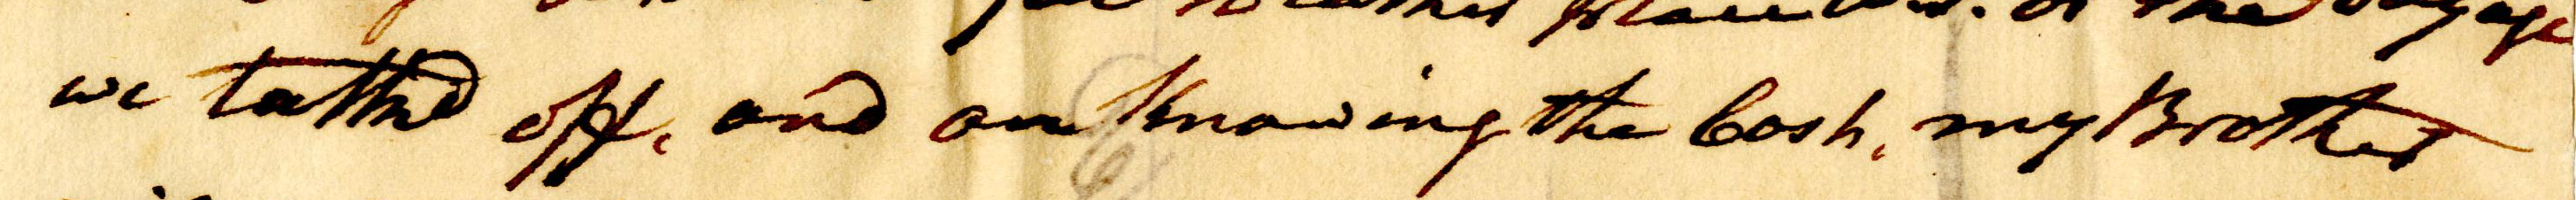we talk^d off. and am knowing the Cash. my Brother
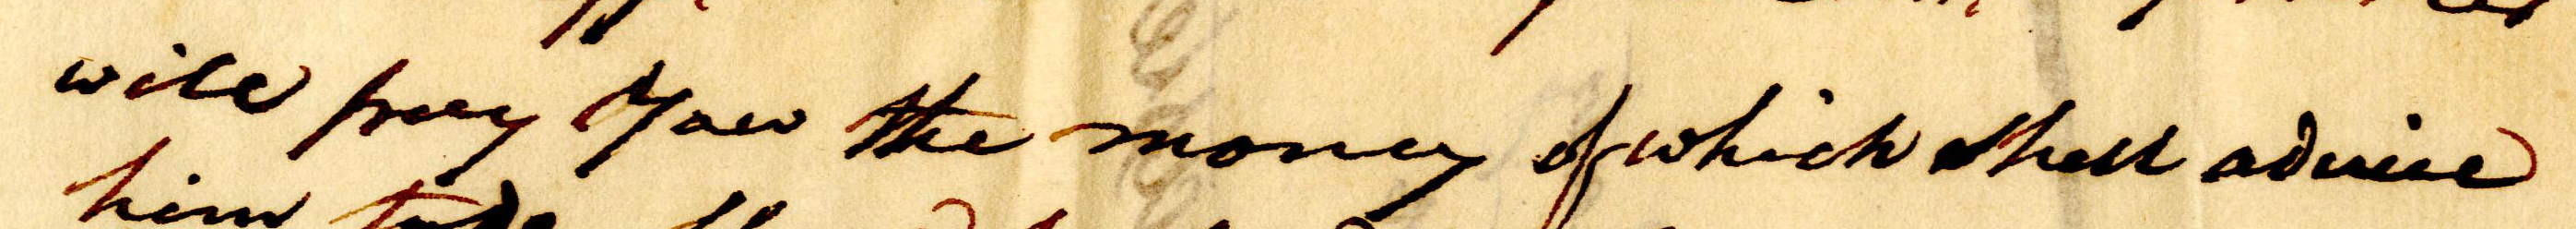will pay you the money of which I shall advise
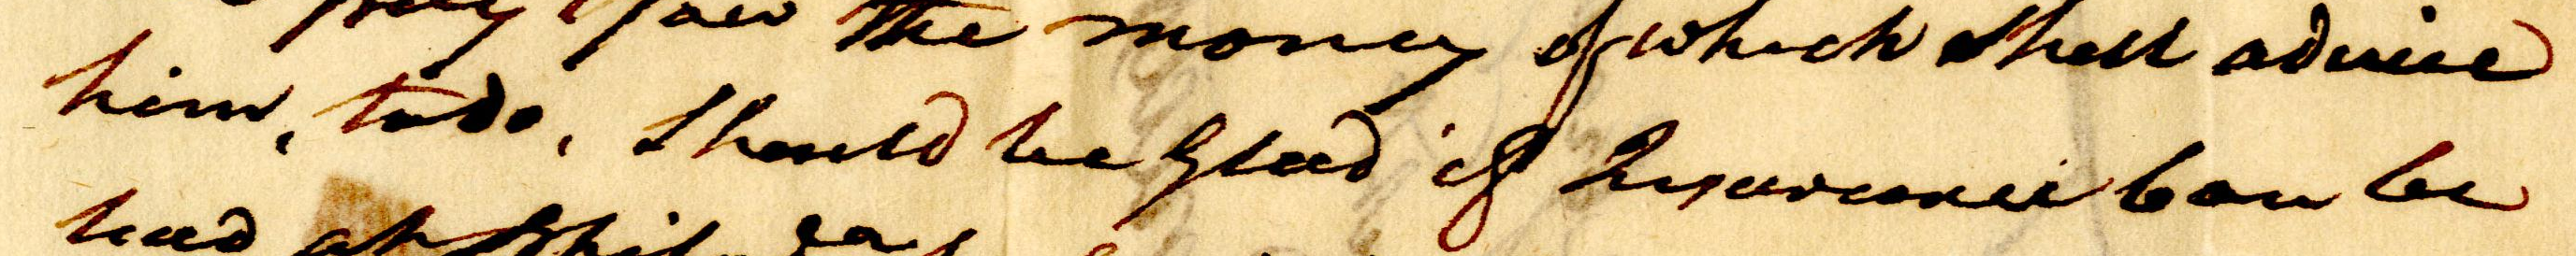him, to do, should be glad if Insureance can be
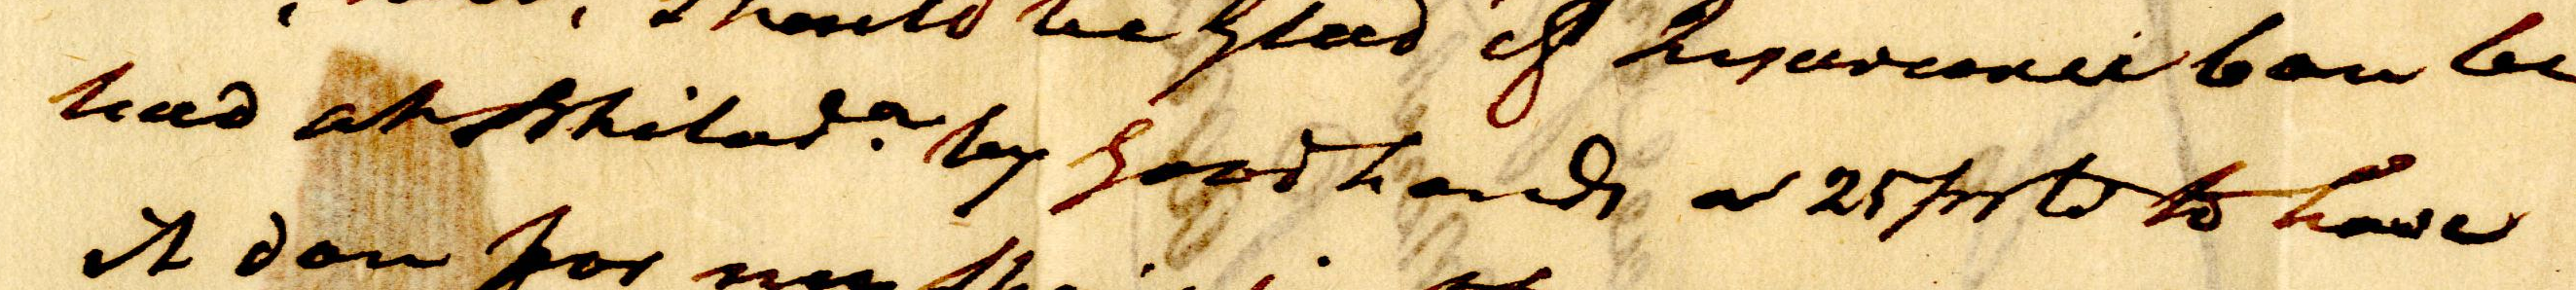had at philad^a by good hands, as 25 per to have
